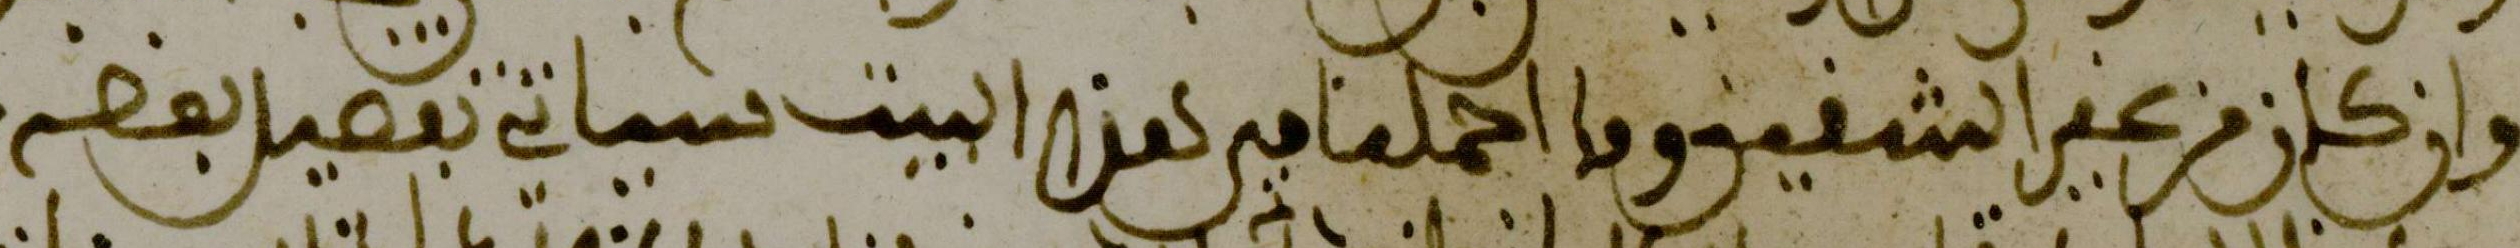وان كان من غير الشقيق وما اجملنا في هذا البيت سياتي تفصيل بعضه
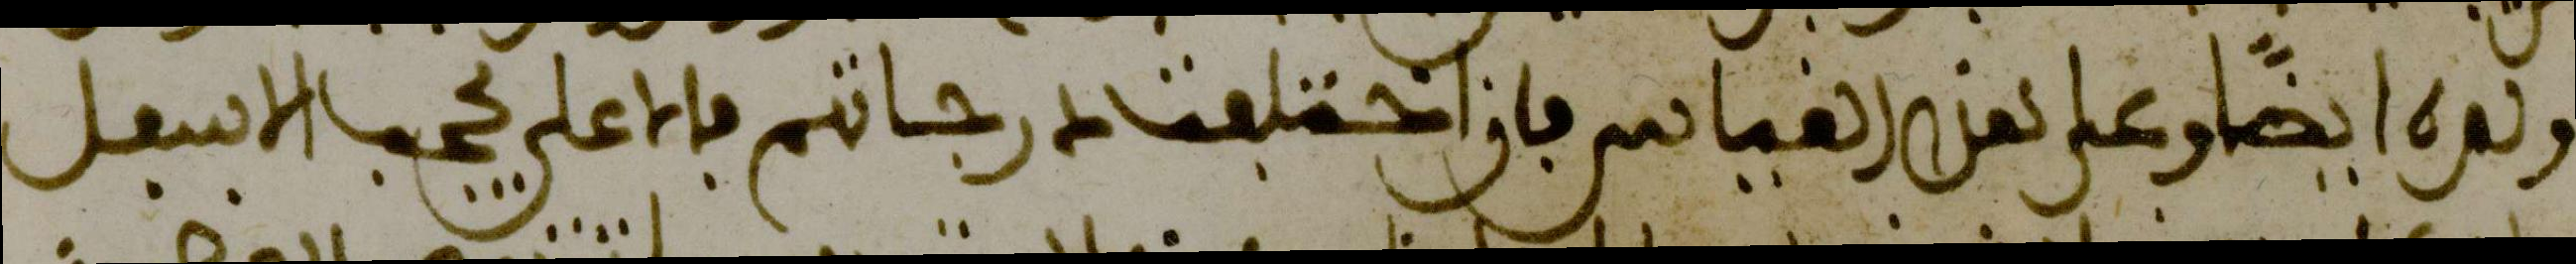ولده ايضًا وعلى هذا القياس فان اختلفت درجاتهم فالاعلى يحجب الاسفل
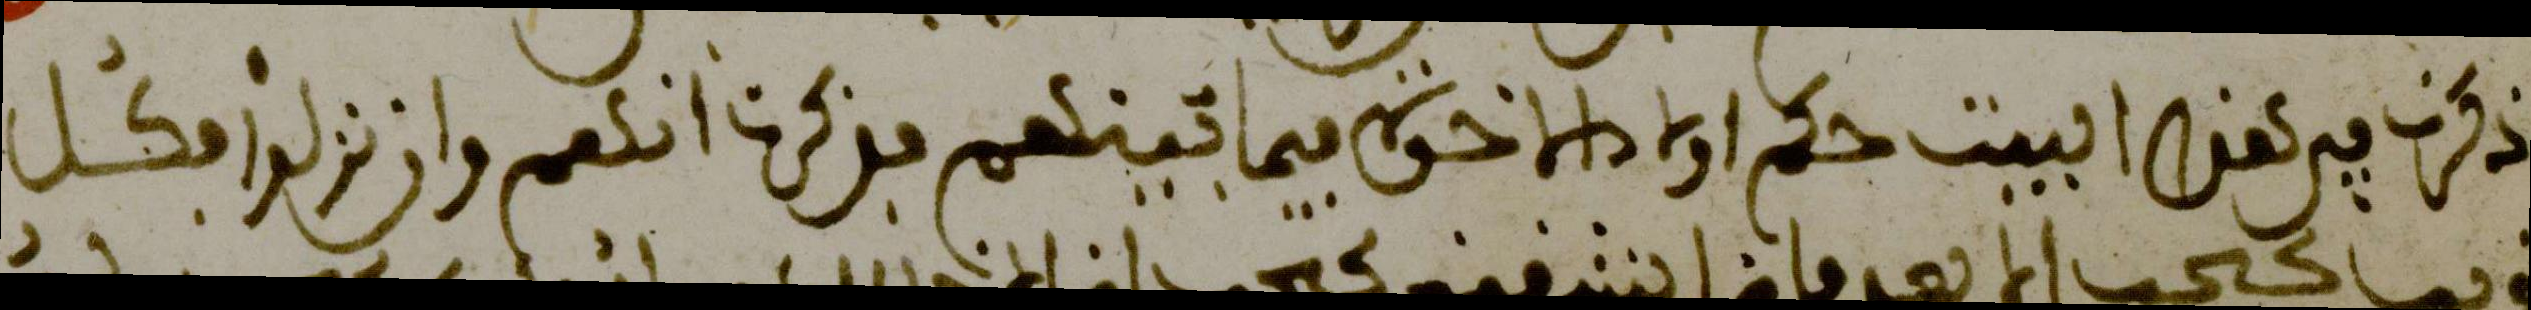ذكرن في هذا البيت حكم اولاد الاخوة فيما بينهم فزكرن انهم وان نزلوا فكل
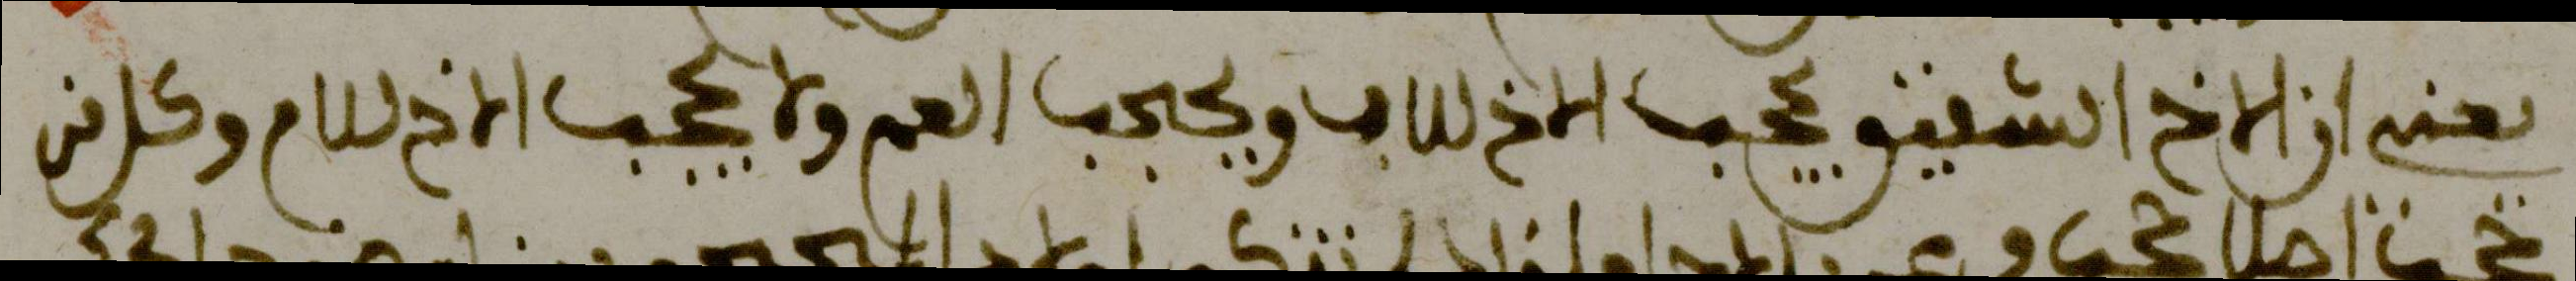يعني ان الاخ الشقيق يحجب الاخ للاب ويحجب العم ولا يحجب الاخ للام وكل من
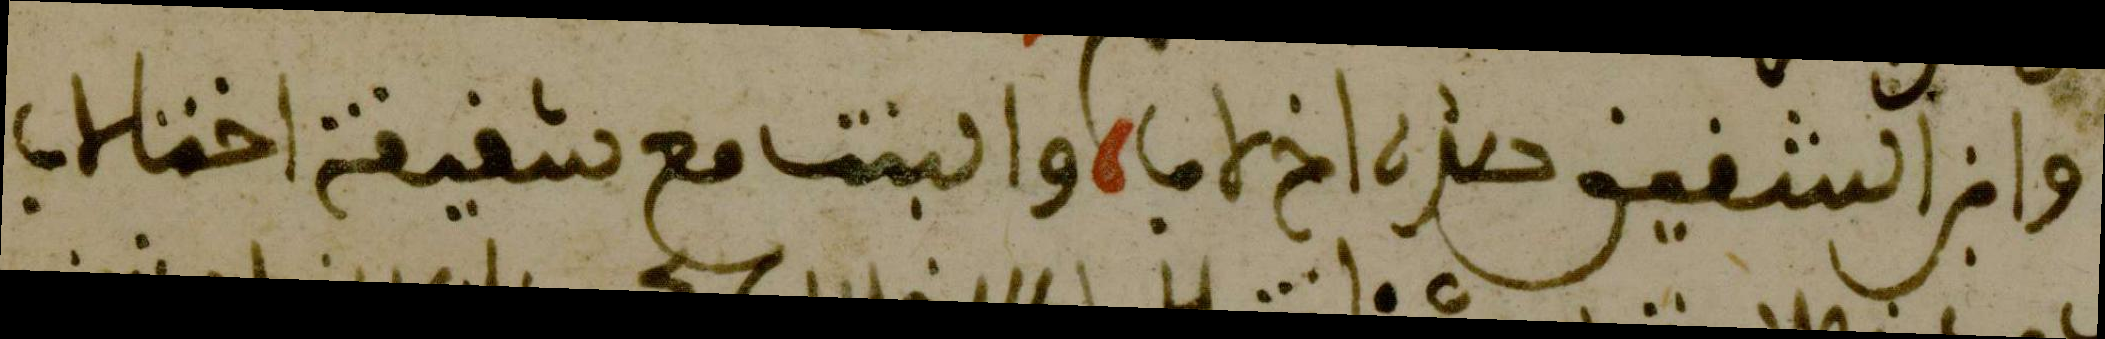وابن الشقيق صده اخ لاب والبنت مع شقيقة اختا الاب
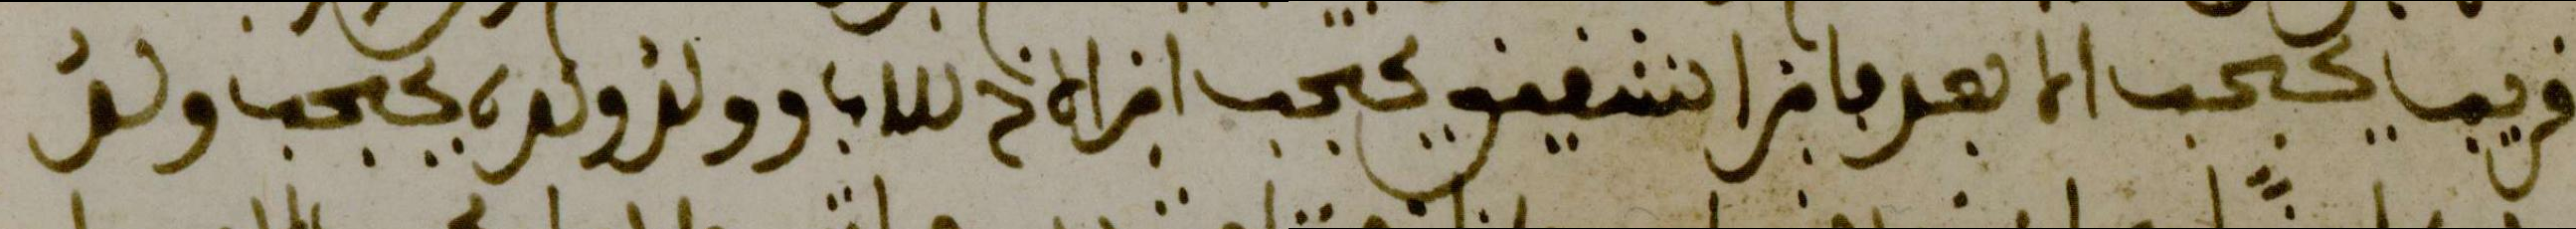قريب يحجب الا بعد فابن الشقيق يحجب ابن الاخ للاب وولد ولده يحجب ولد
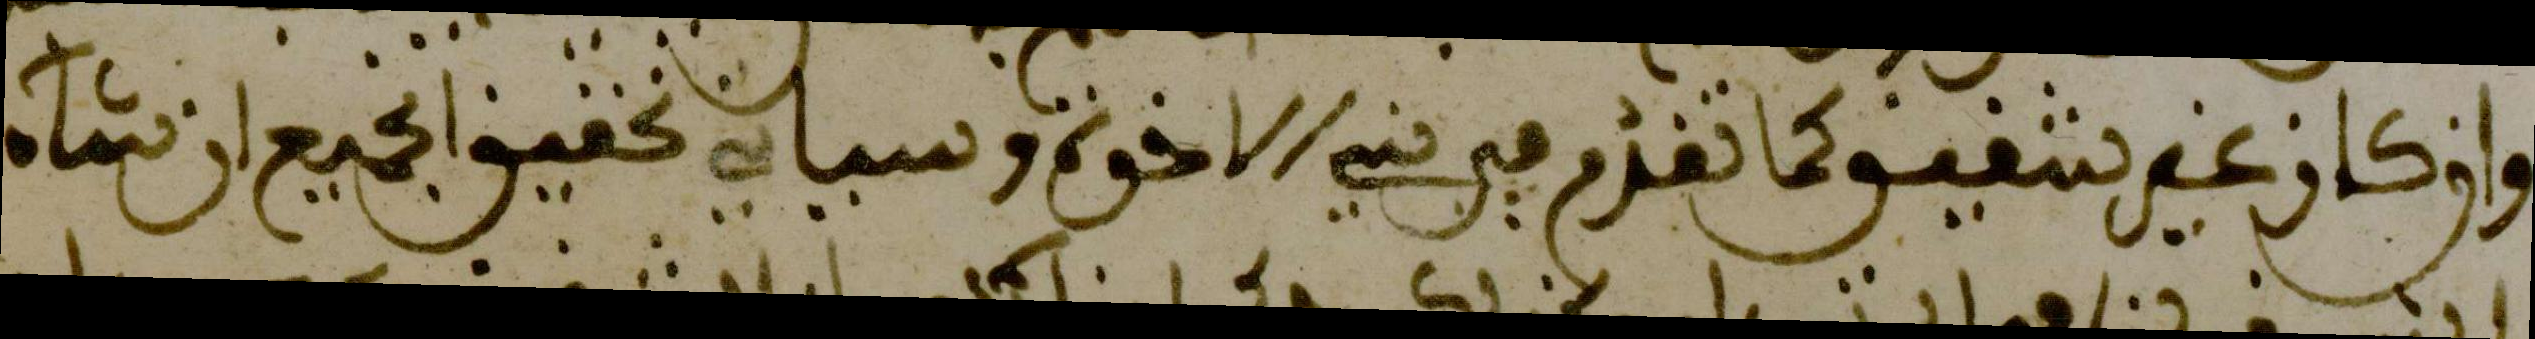وان كان غير شقيق كما تقدم في بني الاخوة وسياتي تحقيق الجميع ان شاء
